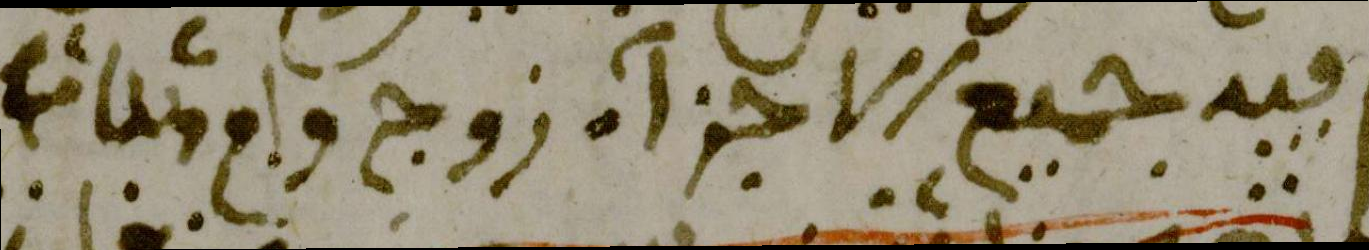فيه جميع الاجزاء زوج وام ثلاث
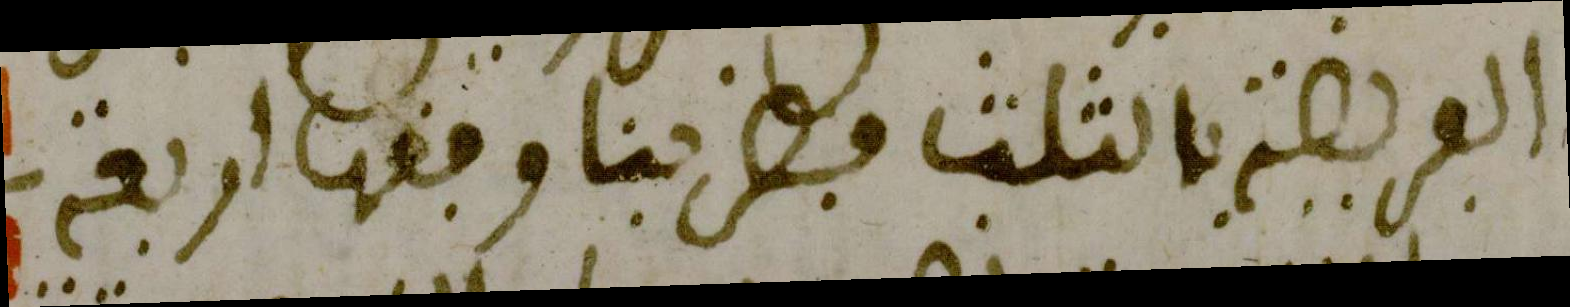الفريضة بالثلث فضربنا وفقها اربعة
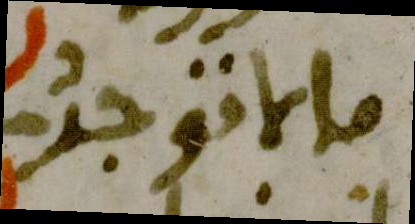ما لا توجد
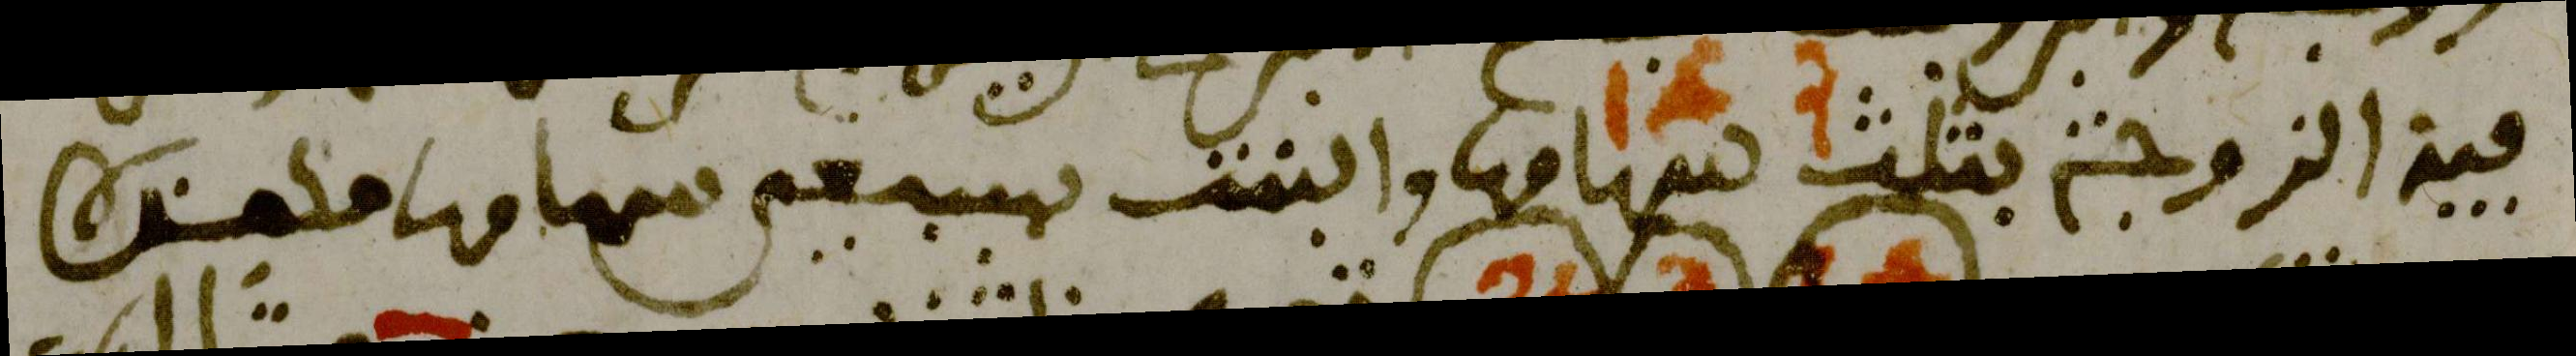فيه الزوجة بثلث سهامها والبنت بسبعى سهامها فهذه
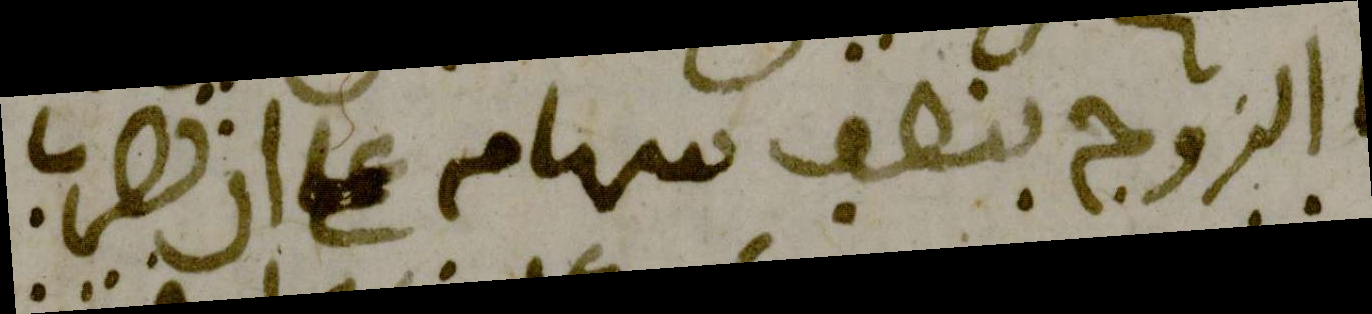الزوج بنصف سهام علي ان تضري
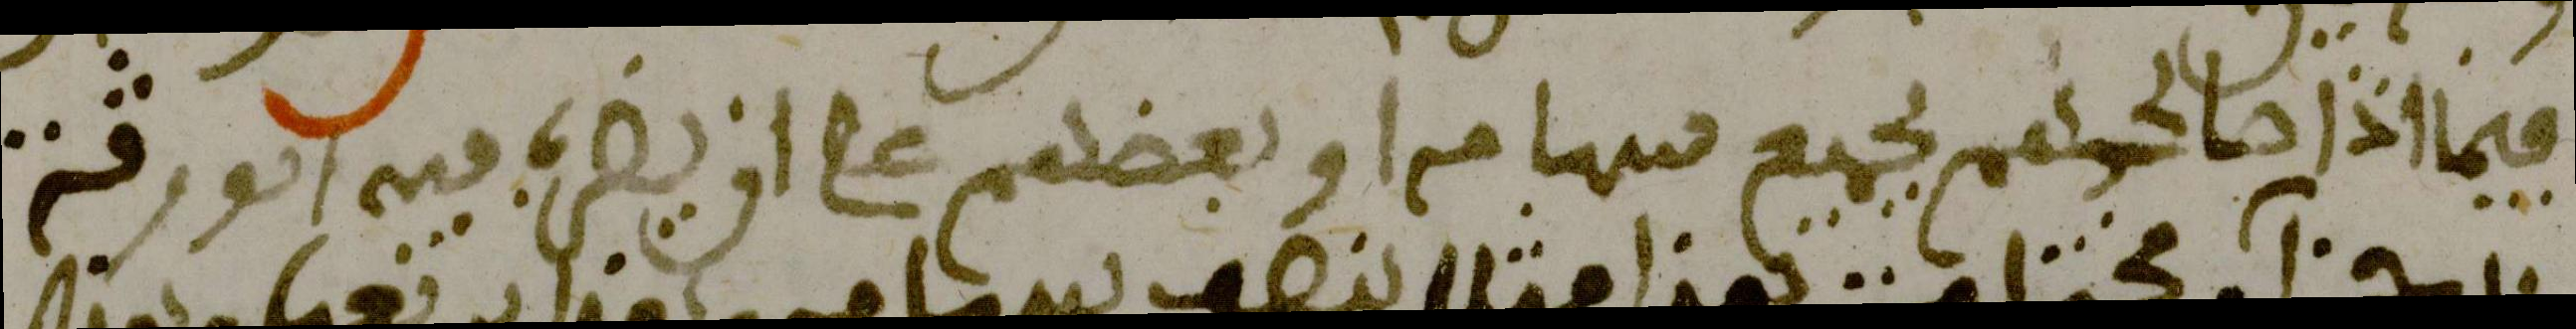فيما اذا صالحهم بجميع سهامه او بعضهم على ان يضرب فيه الورثة
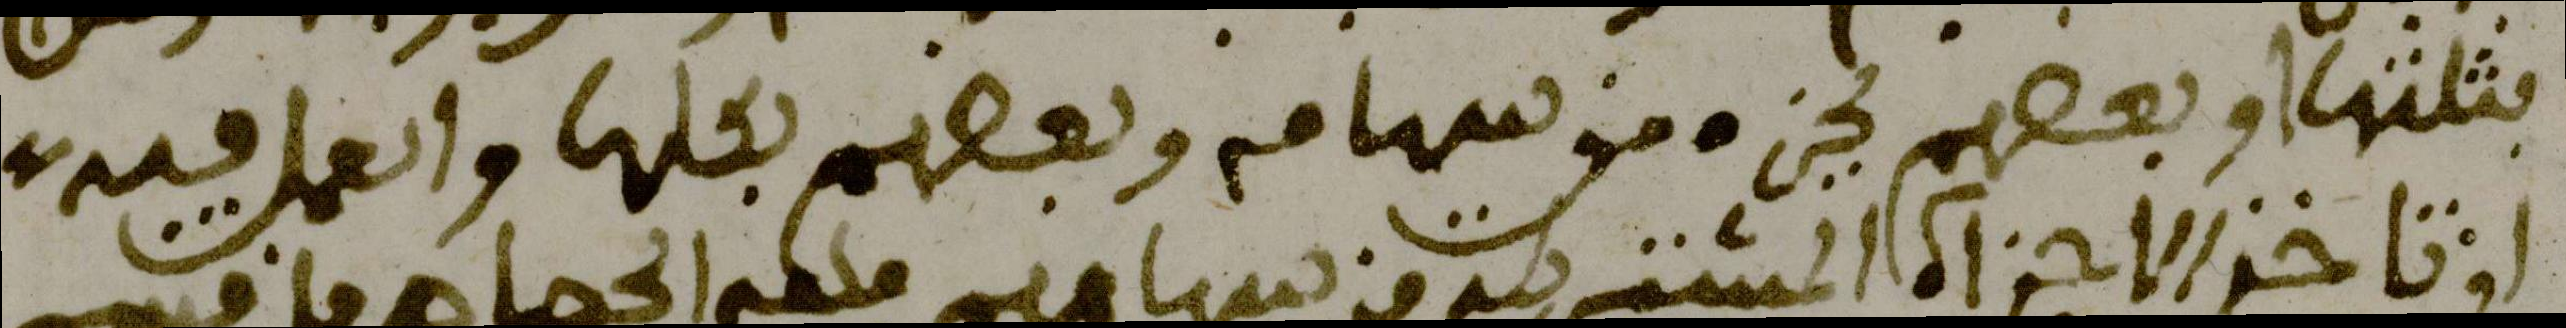بثلثها او بعضهم يجزء سهامه وبعضهم بكلها والعمل فيه
